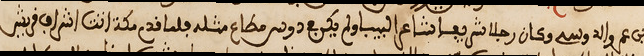بن عمر الدوسى وكان رجلا شريفا شاعرا لبيبا ولم يكن في دوس مطاع مثله فلما قدم مكة اتت اشراف قريش
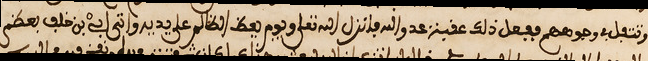وتتفل في وجوههم ففعل ذلك عقبة عدو الله فانزل الله تعلى ويوم يعظ الظالم على يديه واتى ابى بن خلف بعظم
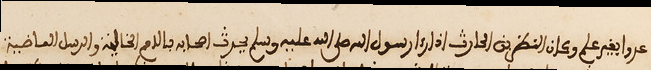عدوا بغير علم وكان النظر بن الحارث اذا رءا رسول الله صلى الله عليه وسلم يحدث اصحابه بالامم الخالية والرسل الماضية
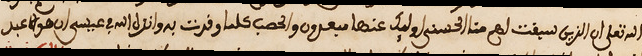الله تعلى ان اللذين سبقت لهم منا الحسنى اولئك عنها مبعدون والحصب كلما وقدت به وانزل الله في عيسى ان هو الا عبد
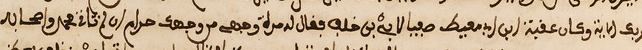ربك الاية وكان عقبة بن ابي معيط صبيا لابي بن خلف فقال له مرة وجهى من وجهك حرام ان لم تاتى محمد واصحابه
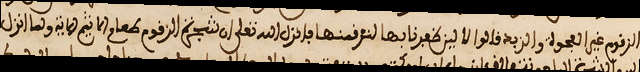الزقوم غير العجوة والزبد قالوا لا لين ظفرنا بها ل#زفمنها فانزل الله تعلى ان شجرة الزقوم طعام الاثيم الاية ولما انزل
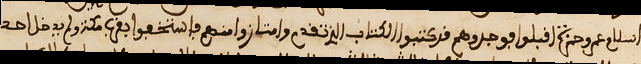اسلام عمر وحمزة اقبلوا فوجدوهم قد كتبوا الكتاب الذي تقدم وامتازوا منهم فاستخفوا بقرب مكة ولم يدخل احد
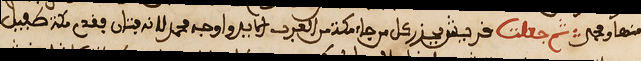منها ومحمد ثم جعلت قريش تحزر كل من جاء مكة من العرب الا يروا وجه محمد لانه فتان فقدم مكة طفيل
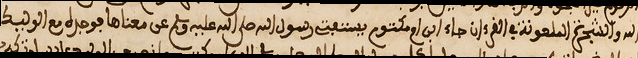الله الشجرة الملعونة في القرءان جاء ابن ام مكتوم يستفتى رسول الله صلى الله عليه وسلم عن معناها فوجده مع الوليد
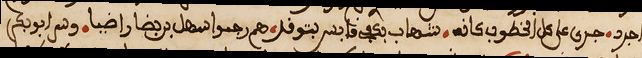اجرد جرى على كل الخطوب كانه شهاب بكفى قابس بتوقد هم رج#وا سهل بن بضا راضيا وسر ابو بكر
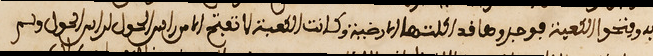به وفتحوا الكعبة فوجدوها قد اكلتها الارضية وكانت الكعبة لا تفتح الا من راس الحول لراس الحول ولم
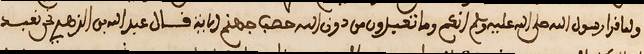ولما قرا رسول الله صلى الله عليه وسلم انكم وما تعبدون من دون الله حصب جهنم الاية قال عبد الله بن الزهري نحن نعبد
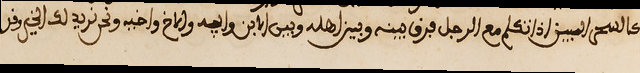كالسحر المبين اذا تكلم مع الرجل فرق بينه وبين اهله وبين الابن وابيه والاخ واخيه ونخن نريد لك الخير وقد
